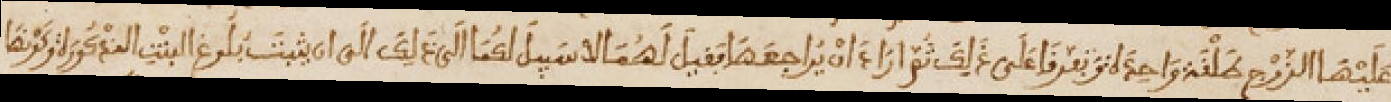عليها الزوج طلقة واحدة وتفرقا على ذلك ثم اراد ان يراجعها فقيل لهما لا سبيل لكما الى ذلك الا ان يثبت بلوغ البنت المذكورة وكونها
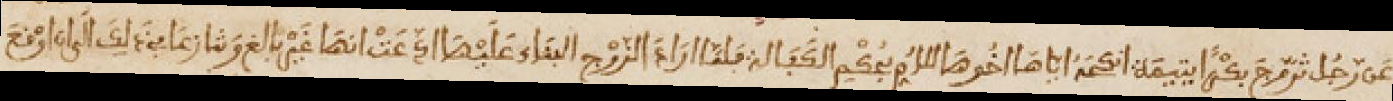عن رجل تزوج بكرا يتيمه انكحه اياها اخوها الامي بحكم الكفالة فلما اراد الزوج البناء عليها ادعت انها غير بالغ و تنازعا في ذلك الى ان اوقع
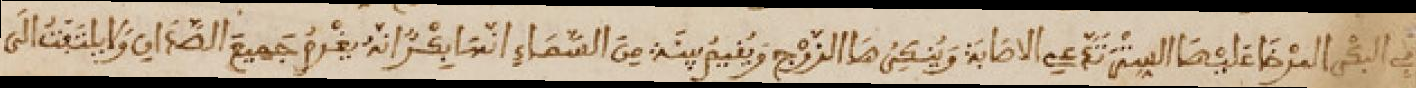في البكر المرضا عليها الستر تدعي الإصابة وينكرها الزوج ويقيم بينة من السماء انها بكر انه يغرم جميع الصداق ولا يلتفت إلى
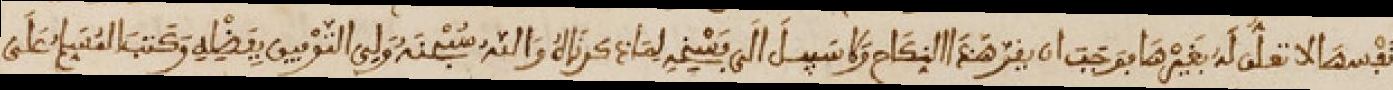نفسها لا تعلق له بغيرها فوجب ان يقر هذا النكاح ولا سبيل الى فسخه لما ذكرناه والله سبحنه ولي التوفيق بفضله وكتب المسلم على
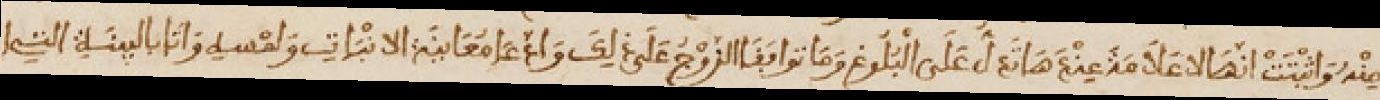منه واثبت انها لا علامه عندها تدل على البلوغ ولم توافق الزوج على ذلك و ادعا معاينه الانبات ولمسه واتا بالبينه التي ا
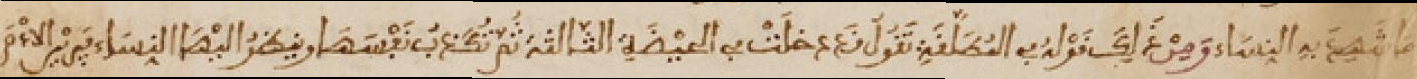ما شهد به النساء ومن ذلك قوله في المطلقة تقول قد دخلت في الحيضة الثالثة ثم تكذب نفسها وينظر اليها النساء فيرين الادم
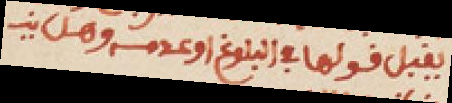يقبل قولها في البلوغ او عدمه وهل ين
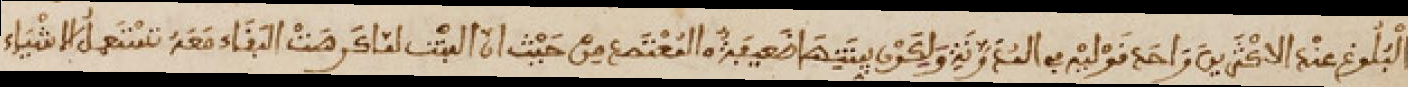البلوغ عند الاكثرين واحد قوليه في المدونة ولكون بنيتها ضعيفة المعتمد من حيث ان البنت لما كرهت البقاء معه تستعمل الاشياء
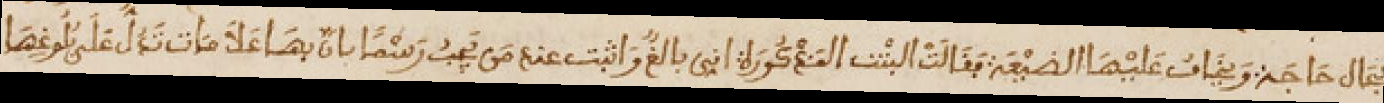بحال حاجة و يخاف عليها الضيعة فقالت البنت المذكورة اني بالغ و اثبت عند من يجب رسما بان بها علامات تدل على بلوغها
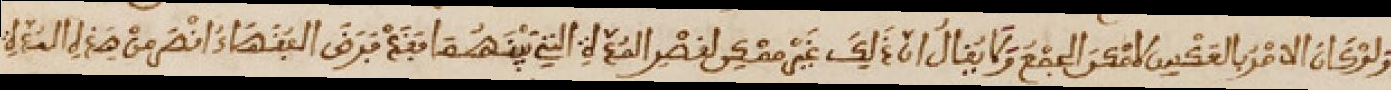ولو كان الامر بالعكس لامكن الجمع ولا يقال ان ذلك غير ممكن لقصر المدة التي بينهما فقد فرض الفقهاء اقصر من هذه المدة
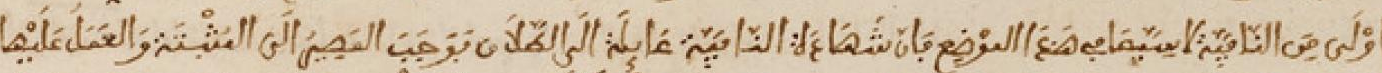اولى من النافية لا سيما في هذا الموضع فان شهادة النافية عائلة الى الطلاق فوجب المصير الى المثبتة والعمل عليها
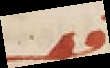قف
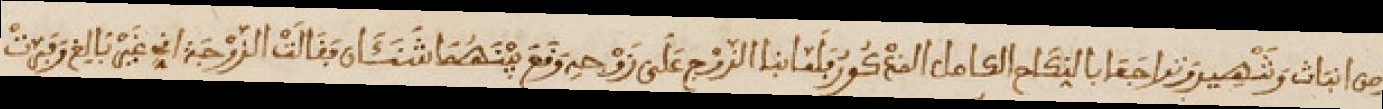من انباث وتنهيد وتراجعا بالنكاح الكامل المذكور فلما بنا الزوج على زوجه وقع بينهما شنئان فقالت الزوجة اني غير بالغ وفرت
